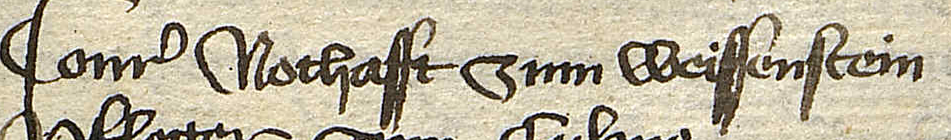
Conr* Nothafft cʒum weiſſenſtein
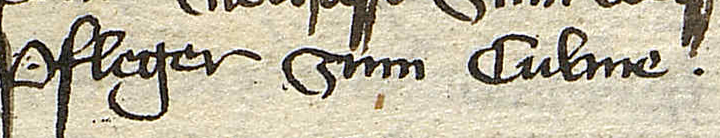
Pfleger cʒum Culme .
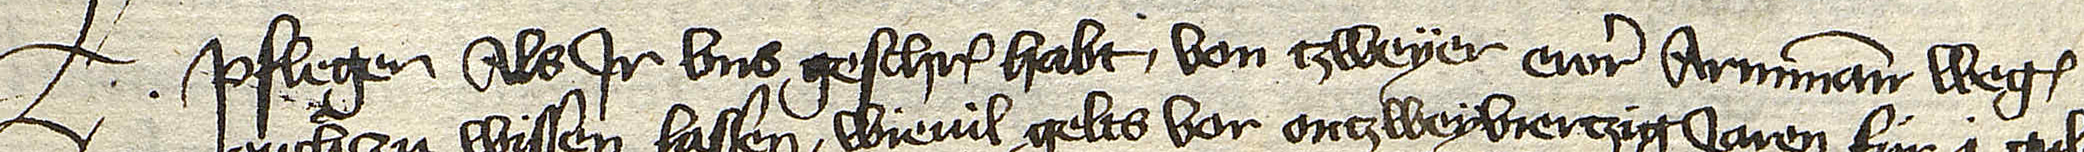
L* . pfleger Als Ir vns geſchr* habt / von cʒweyer ewr* Armman* weg*
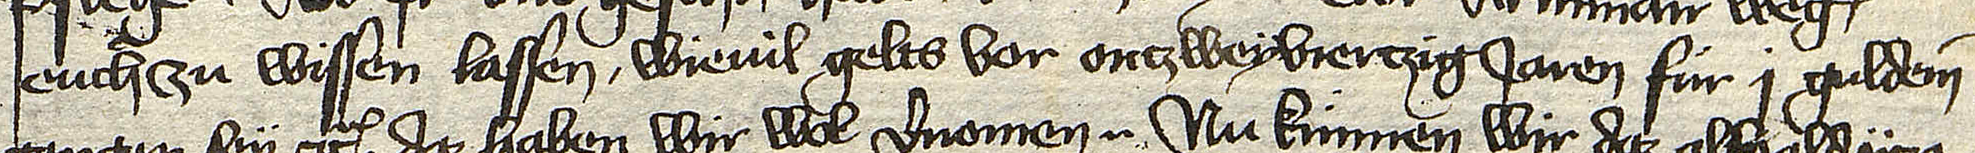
euch cʒu wiſſen laſſen / wieuil gelts vor oncʒweyviercʒig Iaren für i guldein
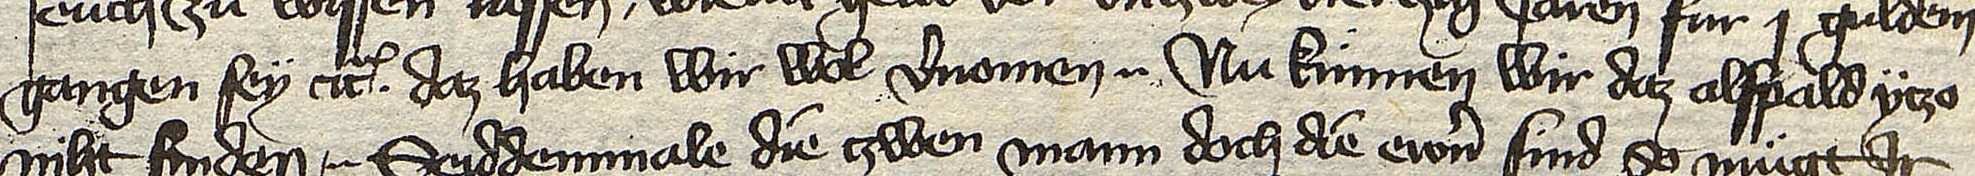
gangen ſey ec* . daʒ haben wir wol v*nomen ~ Nu künnen wir daʒ alſpard ycʒo
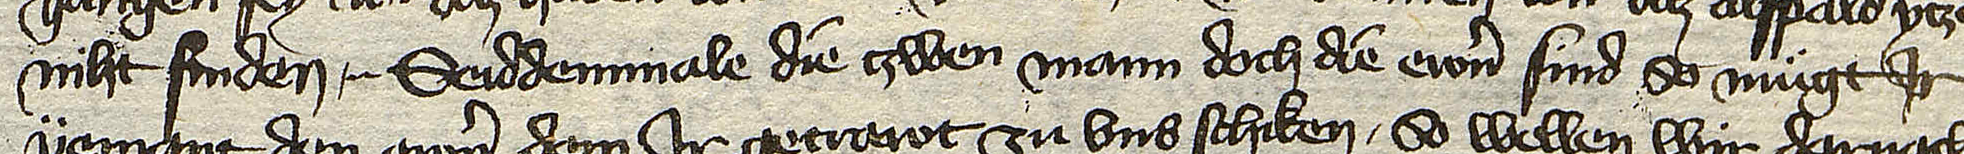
niht finden / ~ Seid demmale die cʒwen mann doch die ewn* ſind So mügt Ir
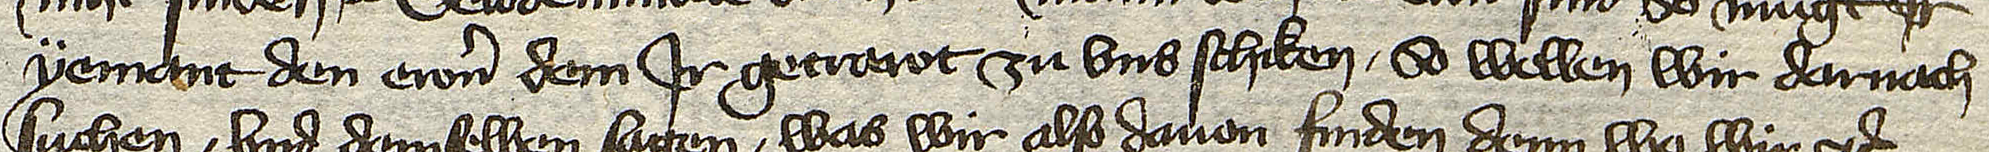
yemant den ewn* dem Ir getrawt cʒu vns ſchiken / So wollen wir darnach
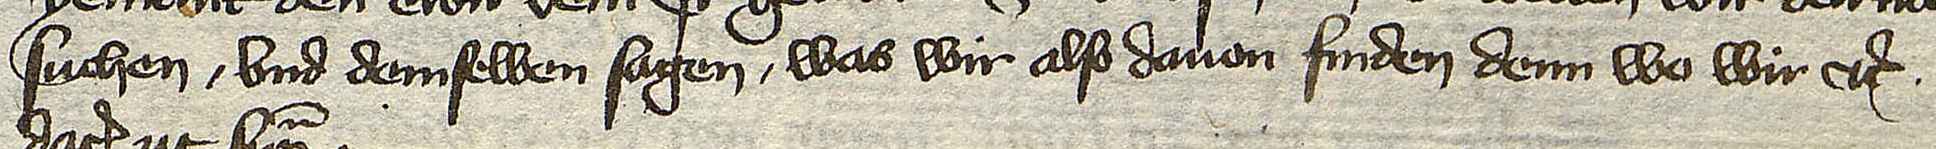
ſuchen / vnd demſelben ſagen / was wir alſo dauon finden denn wo wir ec*
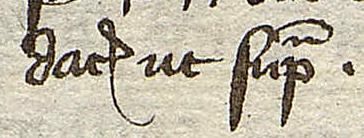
dat* ut ſup* .
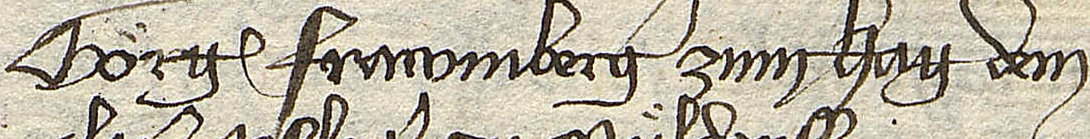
Görg* frawmberg* ʒum Hag dem
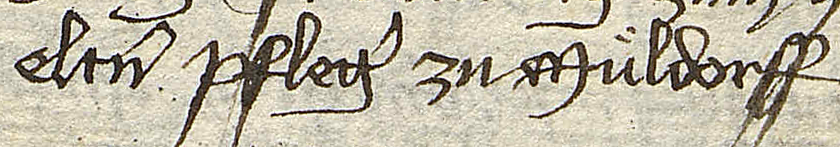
eltn* pfleg* ʒu Müldorff
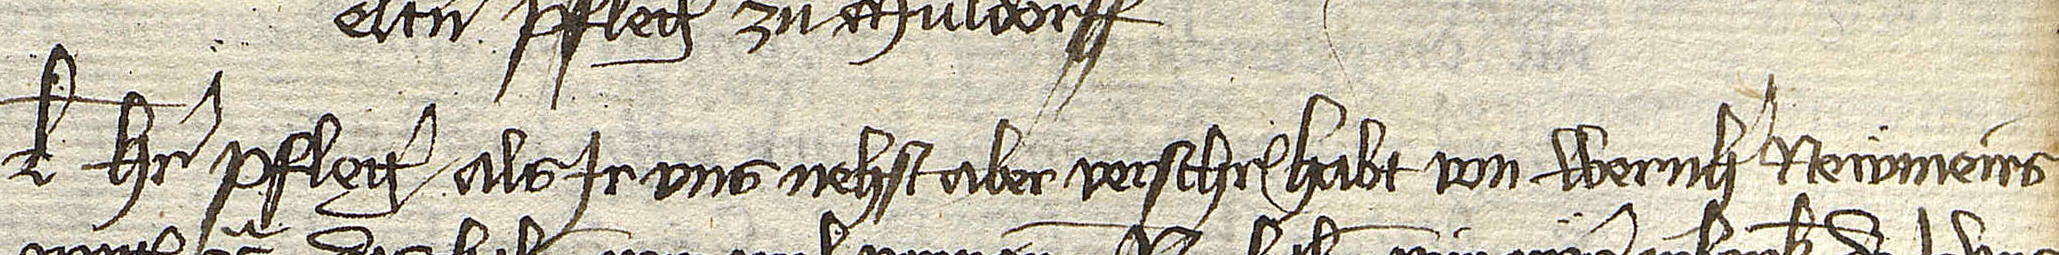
L* hr* pfleg* als Ir vns nehſt aber verſchr* habt von Wernh* Neẅmeirs
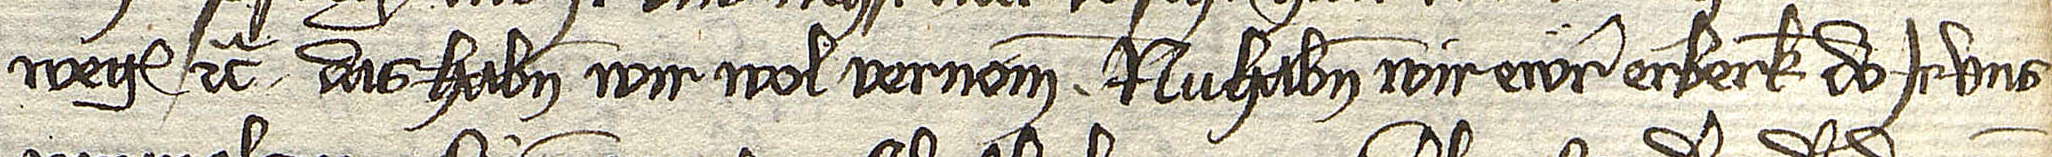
weg* ec* / Das habn* wir wol vernom* . Nu habn* wir eẅr* erberk* do Ir vns
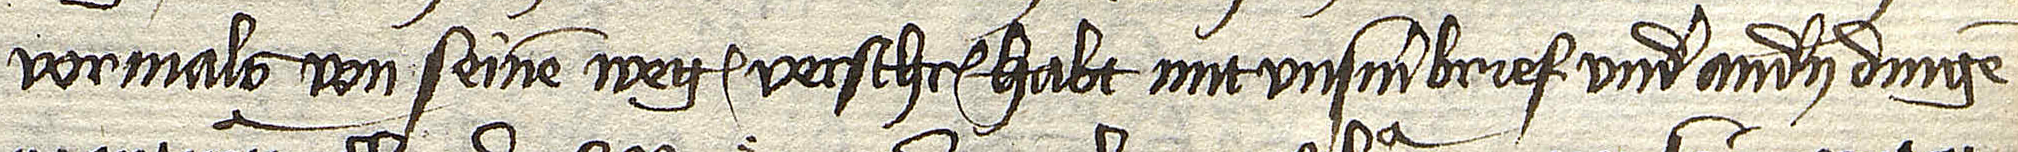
vormals von ſeine* weg* verſchr* habt mit vnſm* brief vnd* andn* dinge*
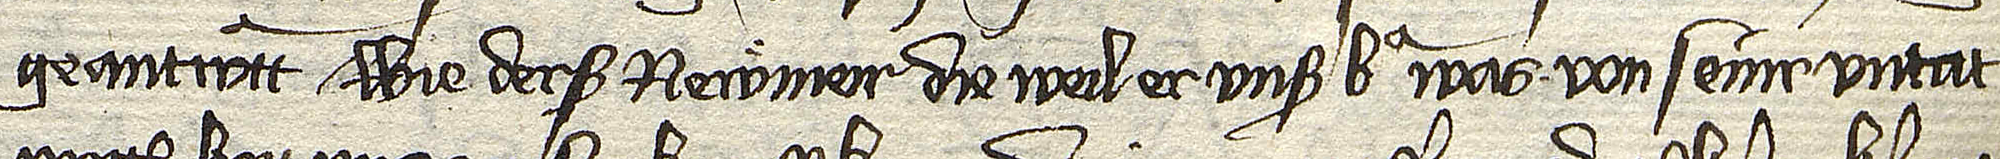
geantw*tt / wie derſ* Neẅmeir die weil er vnſ* b* was von ſeinr vntat
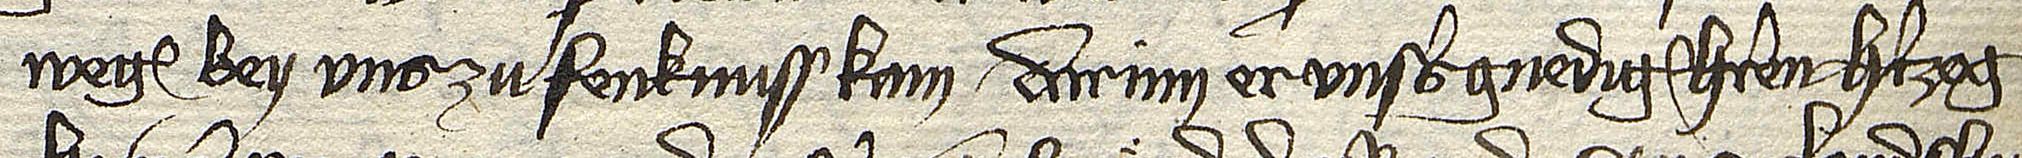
weg* bey vns ʒu fenknuſſ kam / Darinn er vnſ*s gnedig* h*ren h*cʒog
